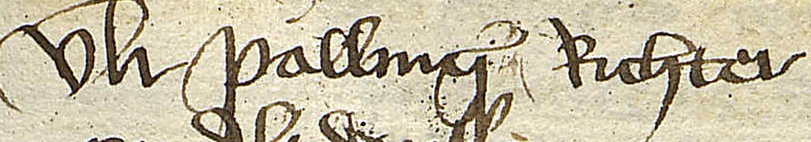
Vlr* Pölling* Richter
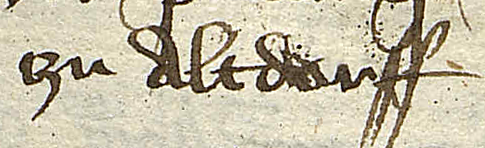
cʒu Altdorff
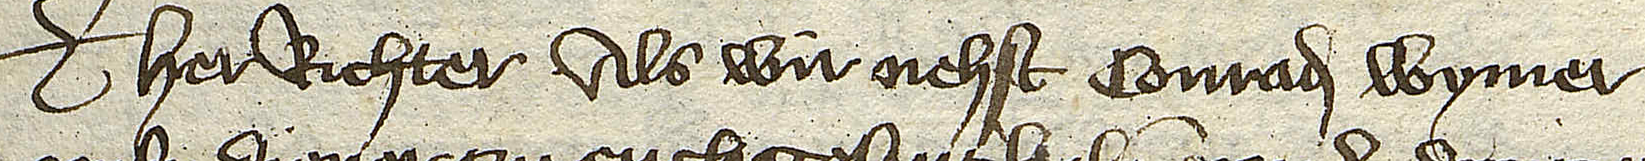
L* her Richter Als wir nehſt Conrad* Wymer
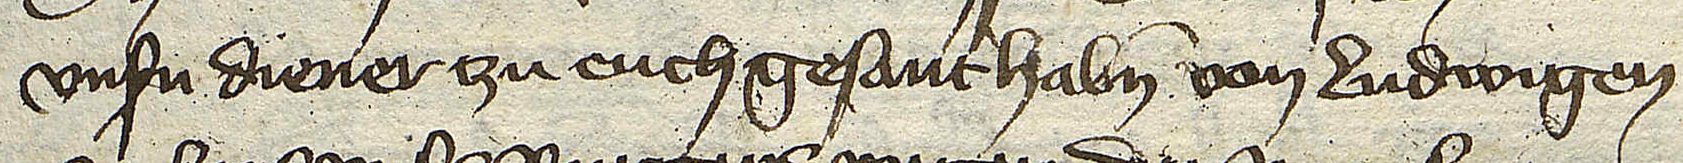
vnſ*n diener cʒu euch geſant hab*n von Ludwigen
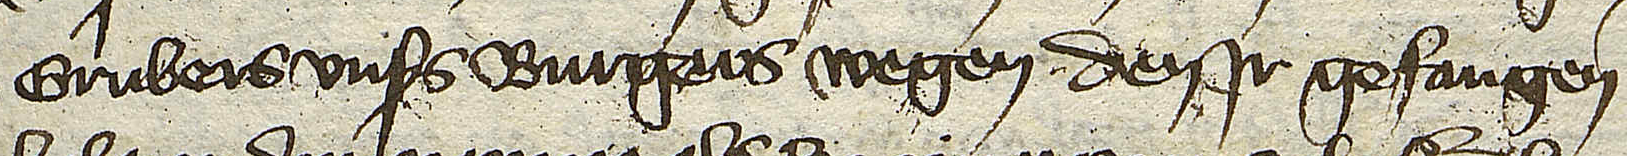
Grubers vnſ*s Burgers wegen . den Ir gefangen
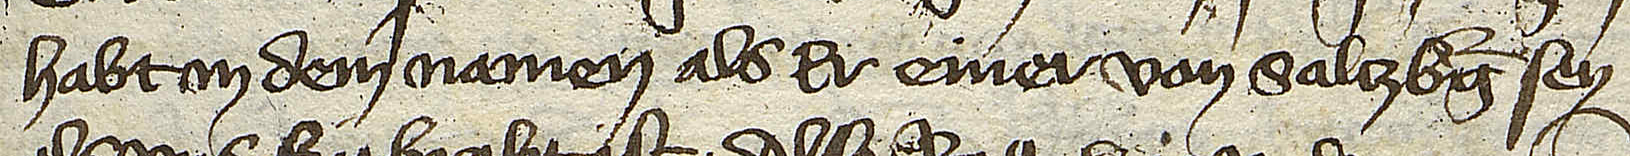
habt in dem namen als Er einer von Salcʒbg* ſey
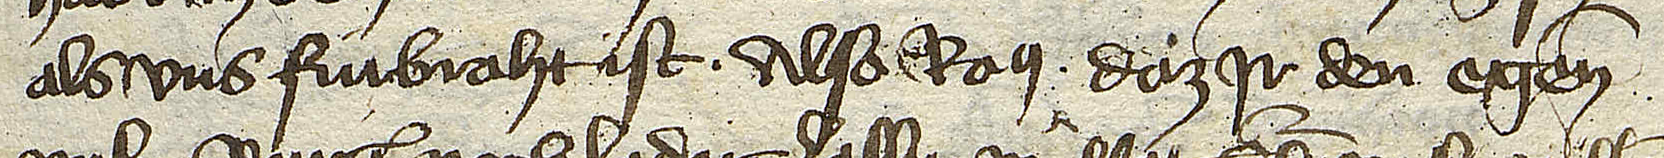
als vns fürbraht iſt . Alſo Ro* . daʒ Ir den egen*
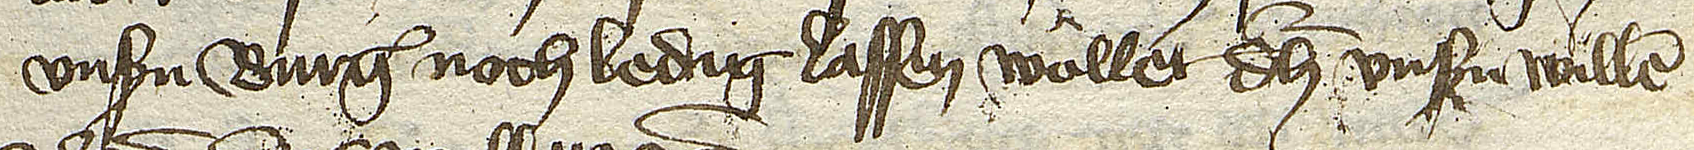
vnſ*n Burg* noch ledig laſſen wöllet dh* vnſ*n wille*
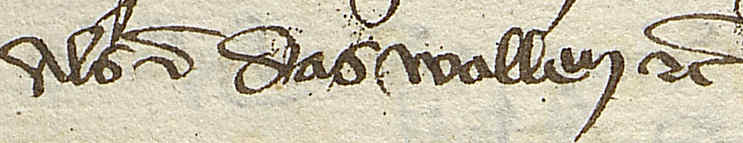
Als ec* Das wollen ec*
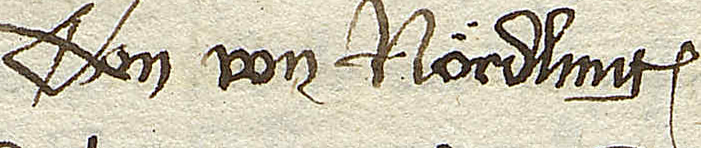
Den von Nördling*
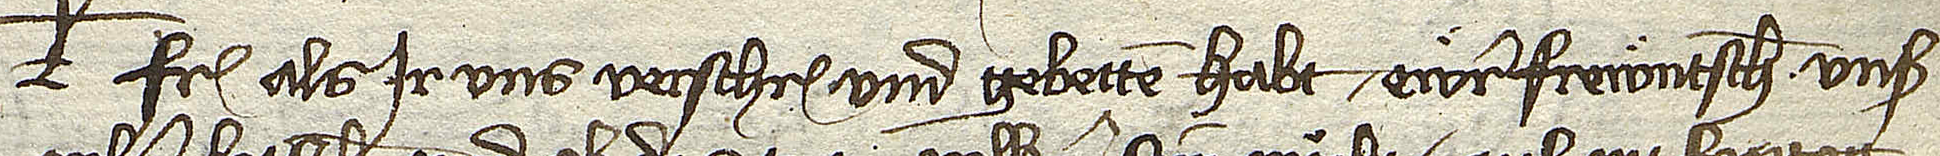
L* fr* als Ir vns verſchr* vnd gebette* habt / ewr* frewntſch* . vnſ*
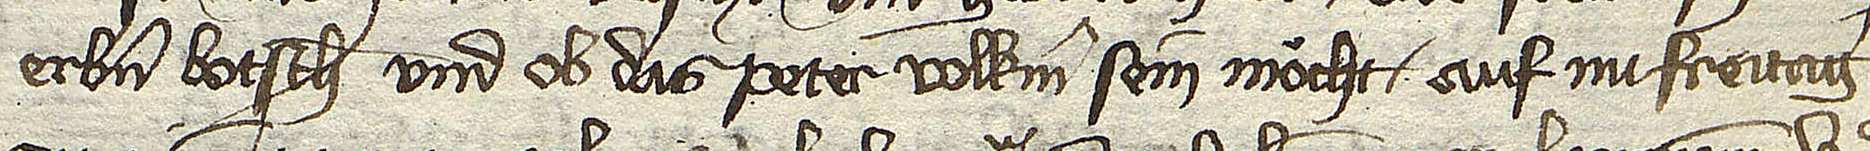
erbn* botſch* vnd ob das peter volkm* ſein möcht / auf nu freitag
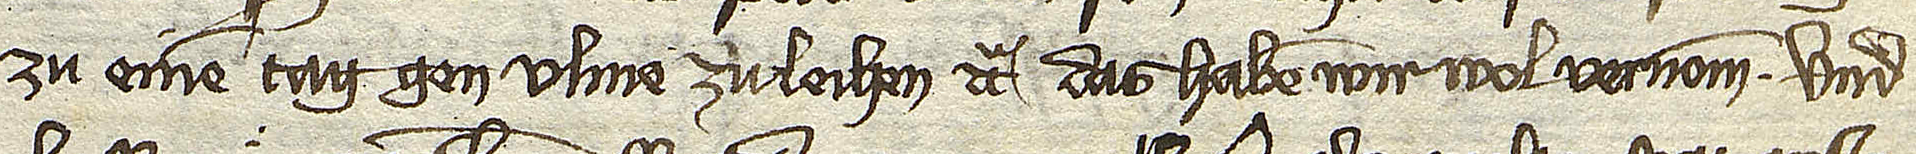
ʒu eine* tag gen Vlme ʒuleihen ec* das habe* wir wol vernom* . Vnd
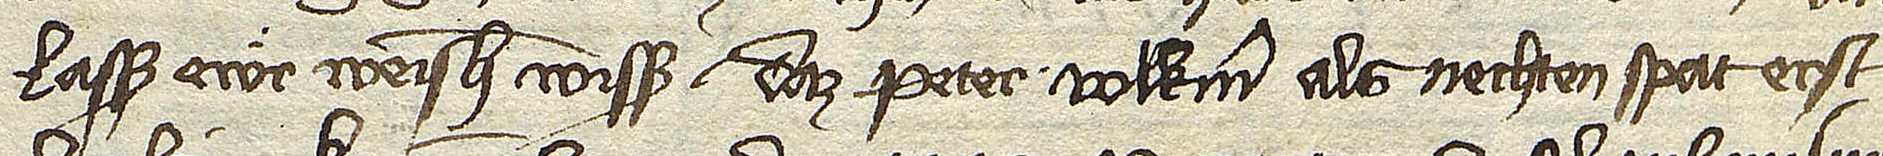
laſſ* ewr weiſh* wiſſ* / Daʒ Peter . volkm* als nechten spat erſt
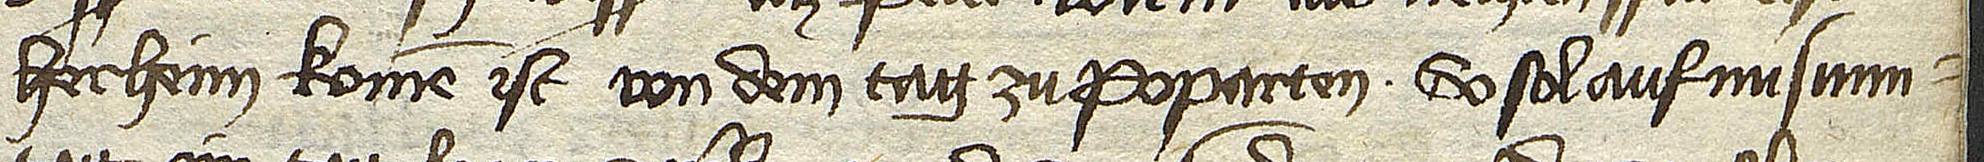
herheim kome* iſt von dem tag ʒu Poparten . So ſol auf nu ſunn =
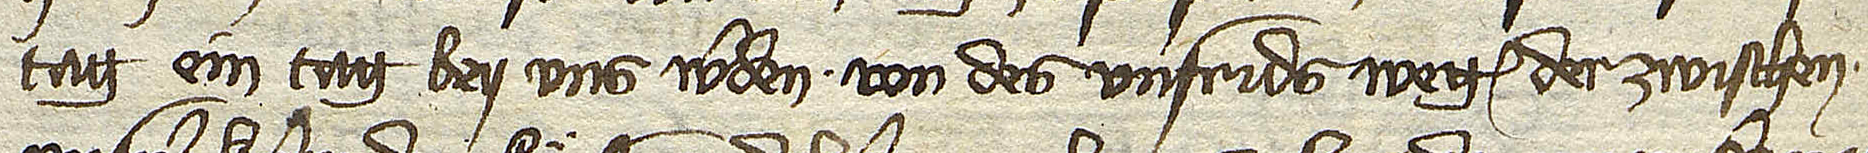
tag ein tag bey vns w*den . von des vnfrids weg* der ʒwiſchen .
